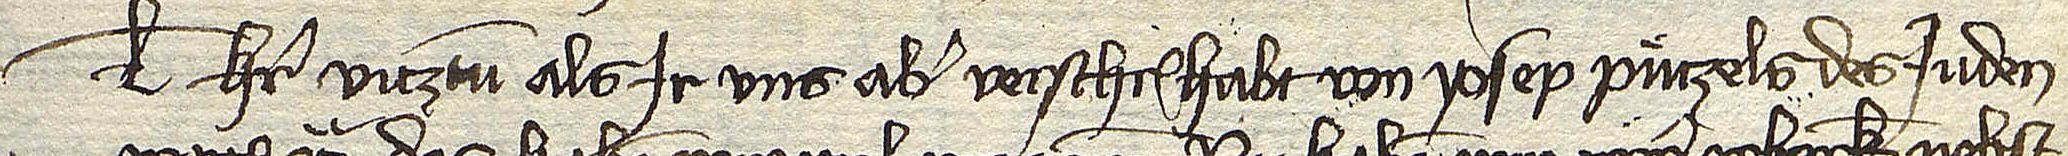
L* Hr* vicʒtu* als Ir vns ab* verſchr* habt von yoſep pücʒels des Iuden
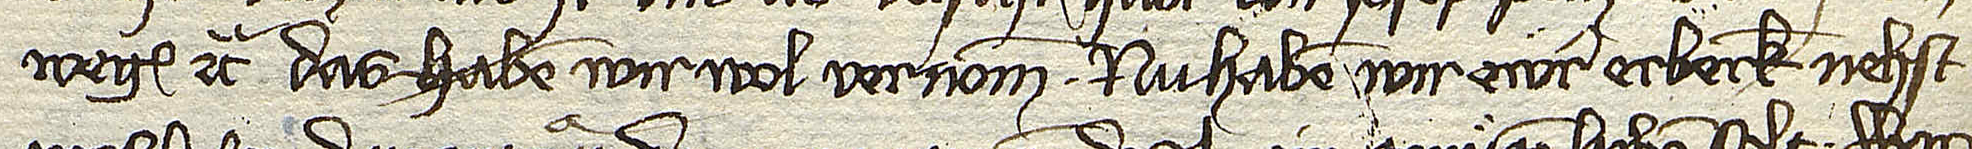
weg* ec* das habe* wir wol vernom* . Nu habe* wir ewr* erberk* nehſt
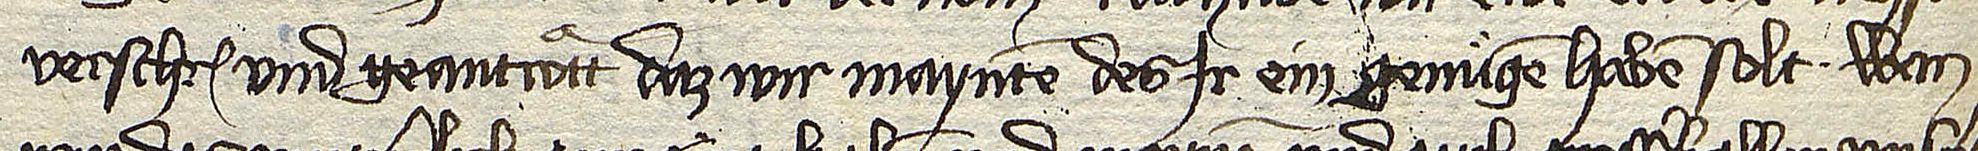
verſchr* vnd geantw*tt daʒ wir maynte* des Ir ein genüge* habe* ſolt . Wan
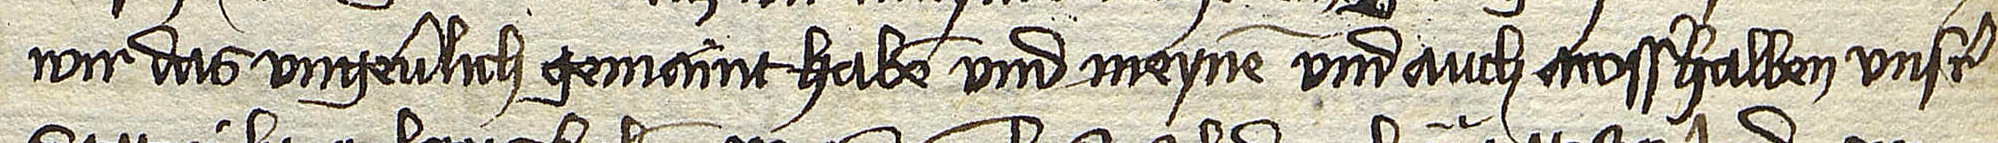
wir das vngeu*lich gemaint habe* vnd meyne* vnd auch awſſ*halben vnſ*r
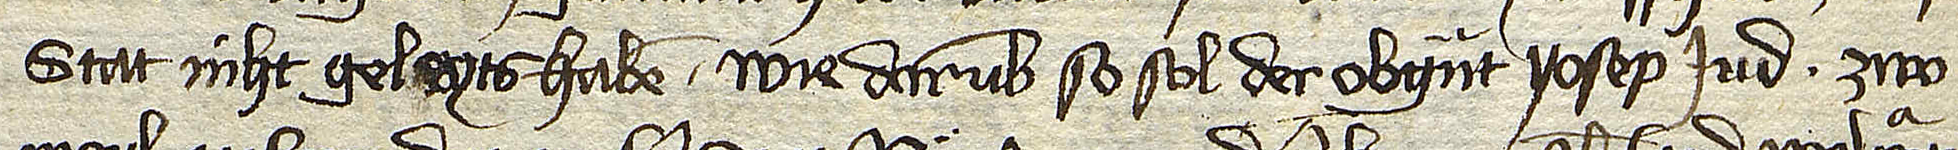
Stat niht geleyts habe* / wie darub* ſo ſol der obgnt* Yoſep Iud . ʒwo
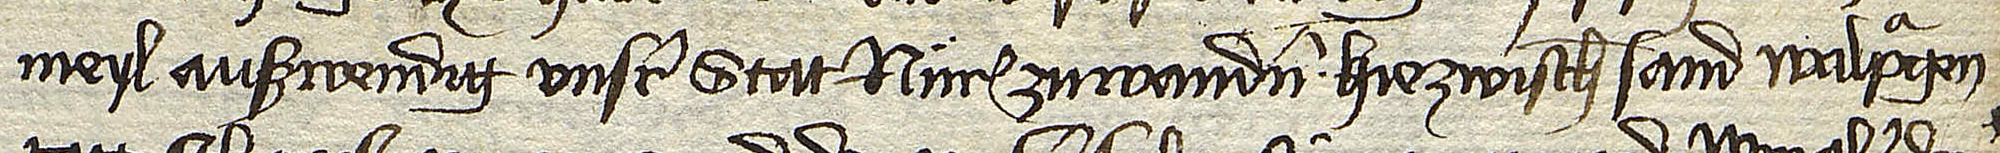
meyl auſʒwendig vnſ*r Stat Nür* ʒuwand*n . hieʒwiſch* ſand walp*gen
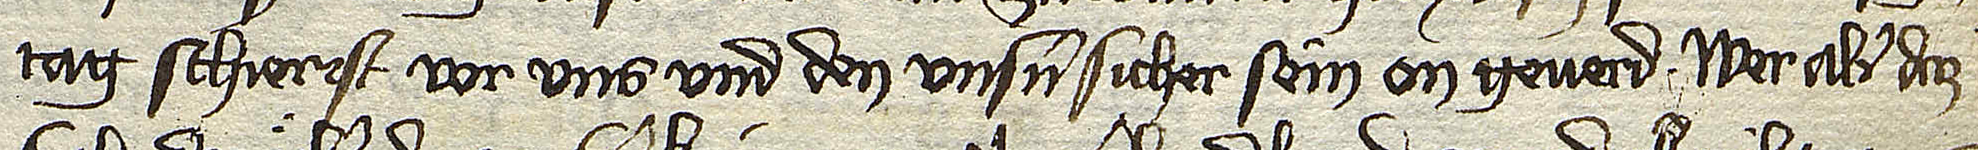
tag ſchieriſt vor vns vnd den vnſ*n ſicher ſein on geuerd . Wer ab* daʒ
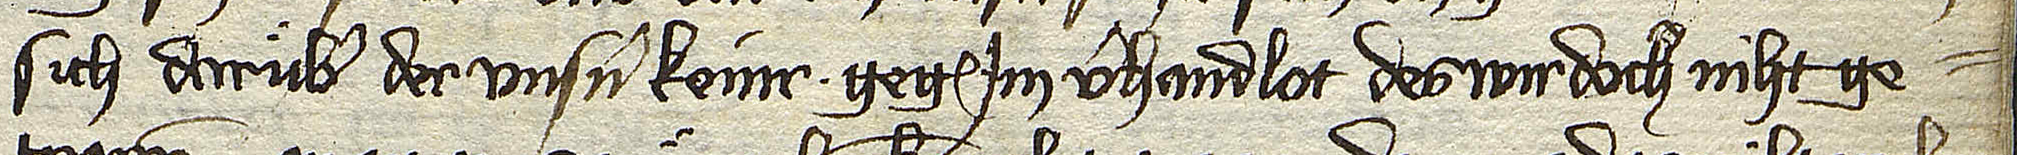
ſich darüb* der vnſ*n keinr . geg* Im v*handlot des wir doch niht ge =
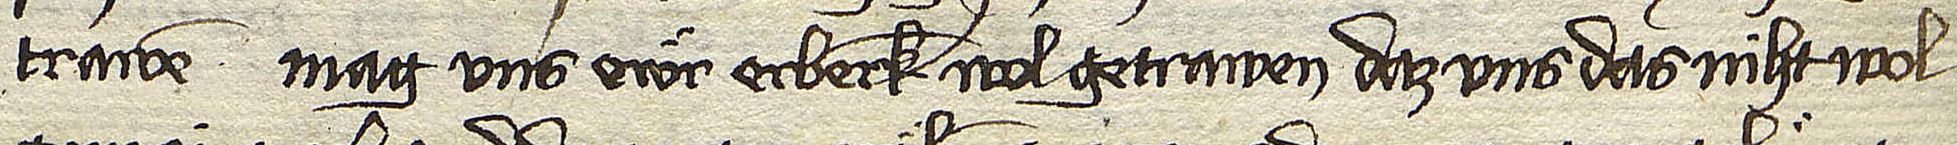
trawe* . mag vns ewr erberk* wol getrawen daʒ vns das niht wol
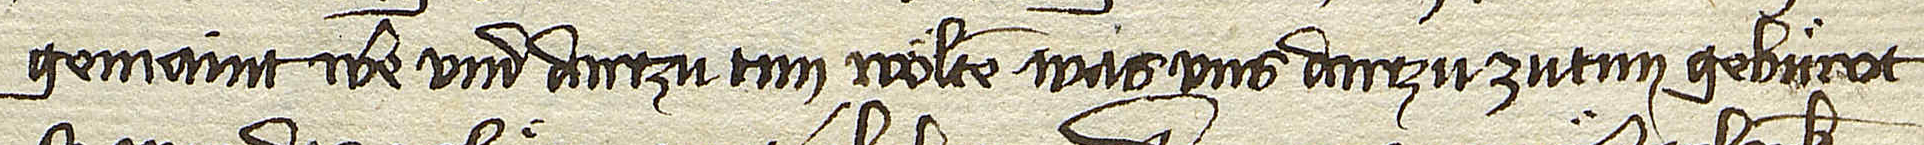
gemaint we* vnd darcʒu tun wölte* was vns darcʒu ʒutun gebüret
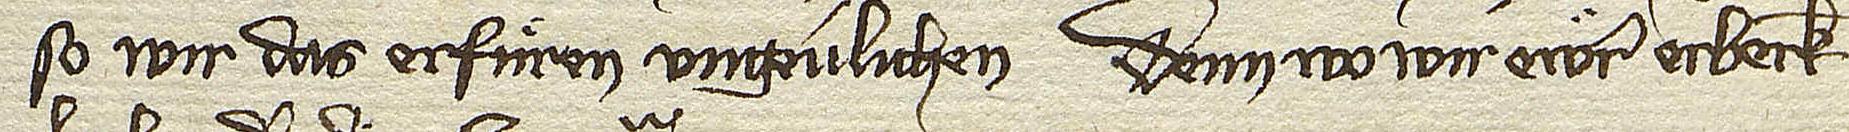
ſo wir das erfüren vngeu*lichen Denn wo wir ewr erberk*
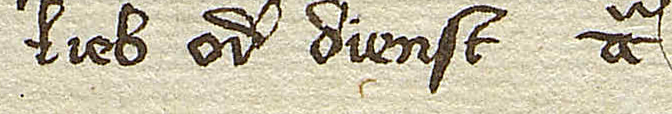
lieb od* dienſt ec*
